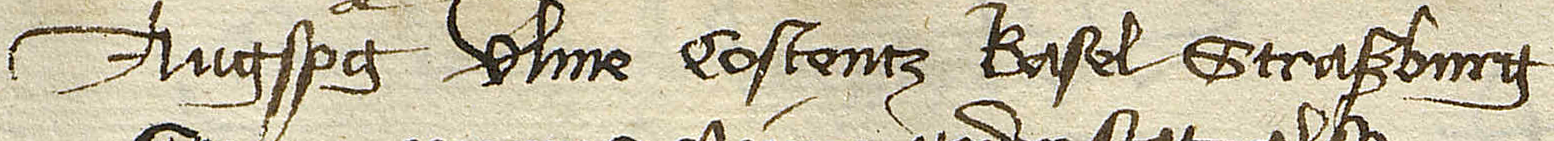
Augſp*g Vlme Coſtencʒ Baſel Straſʒburg
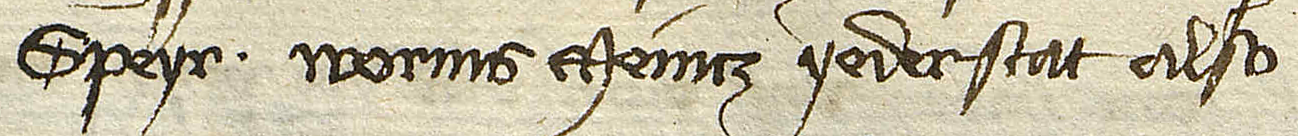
Speyr . worms Meincʒ yeder ſtat alſo
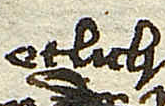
etlich*
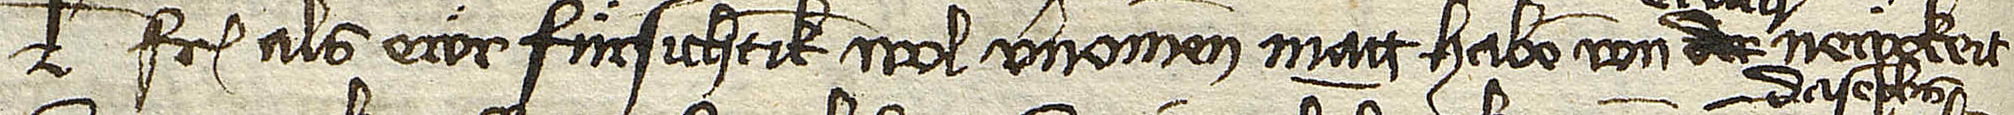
L* fr* als ewr fürſichtik* wol v*nomen* mag habe* von der newekeit
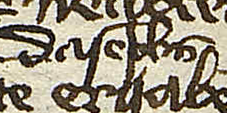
daſelbs
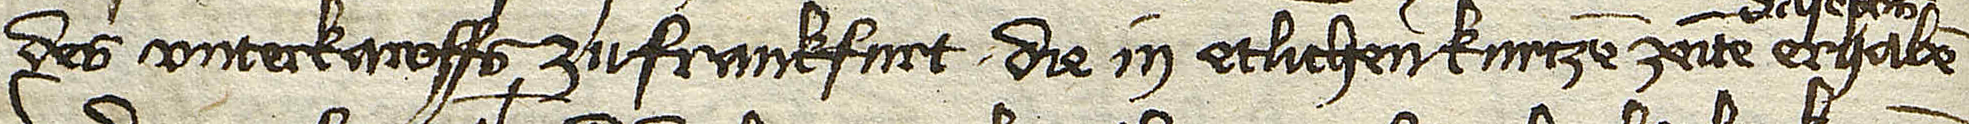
des vnterkawffs ʒu frankfurt . die in etlichen kurcʒe* ʒeite* erhabe*
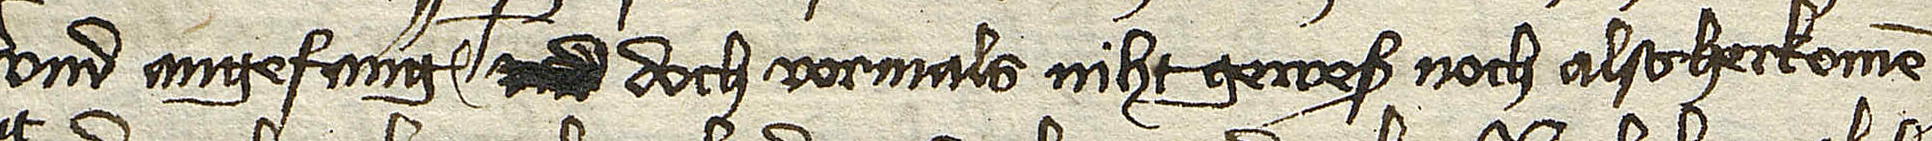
vnd angefang* vnd doch vormals niht geweſ* noch alſo herkome*
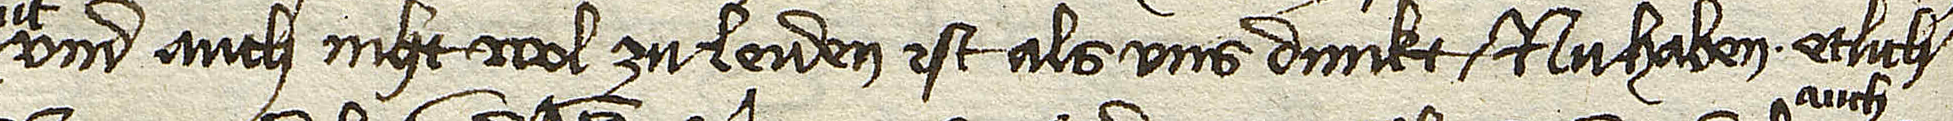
vnd auch niht wol ʒu leiden ist als vns dankt / Nu haben . etlich*
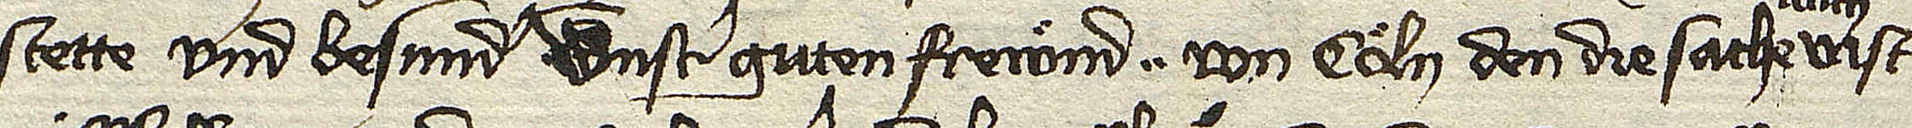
ſtette vnd beſund* Vnſr* guten frewnd ~ von Cöln den die ſache vaſt
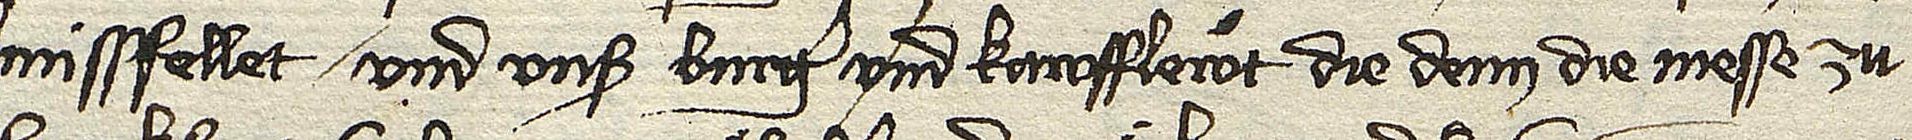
miſſfellet / vnd vnſ* burg* vnd kawfflewt die denn die meſſe ʒu
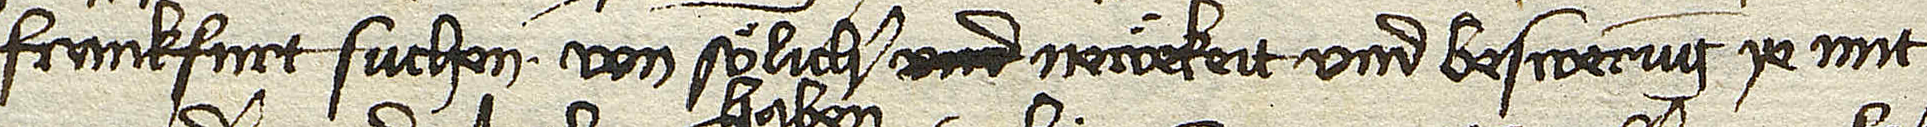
frankfurt ſuchen . von ſölich* vnd newekeit vnd beſwerug* ye mit
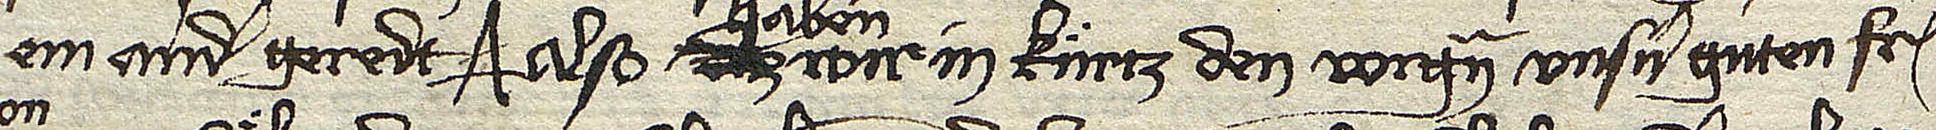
ein and* geredt alſo daʒ wir in kürcʒ den vorgn* vnſn* guten fr*
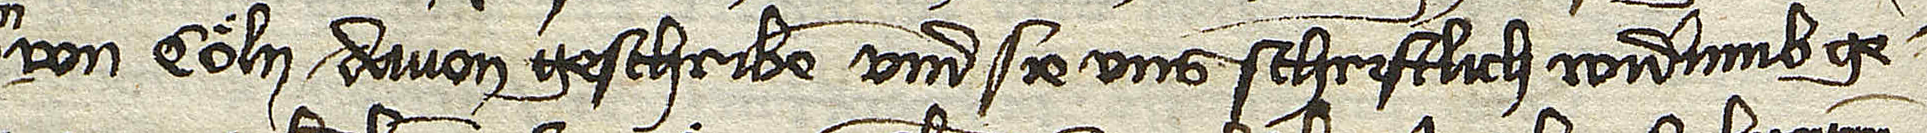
von Cöln / dauon geſchribe* vnd ſie vns ſchriftlich wid*umb ge =
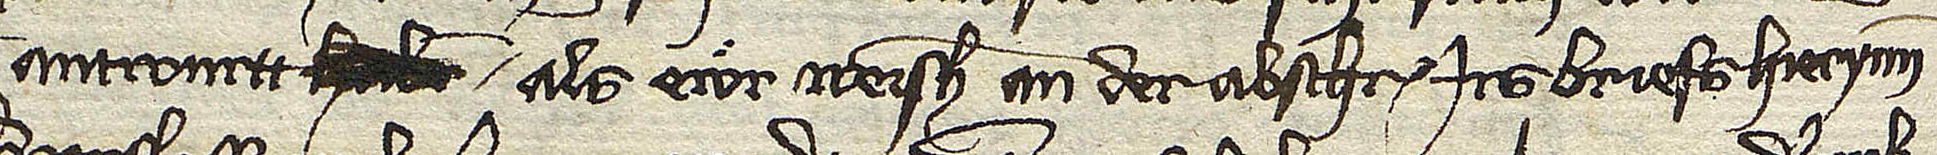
antwrrtt habe* / als ewr weiſh* an der abſchr* Irs briefs hierynn*
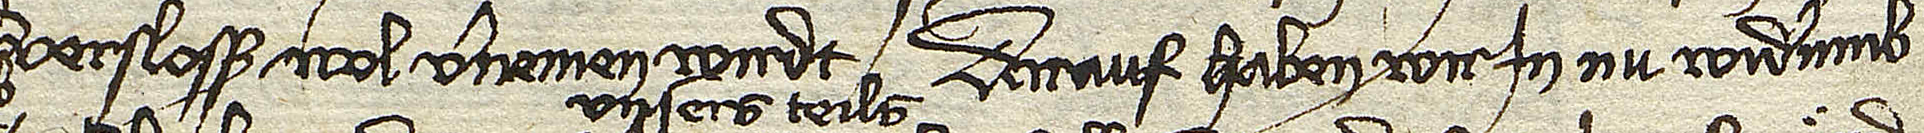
verſloſſ* wol v*nemen wirdt / Darauf haben wir In nu wid*umb
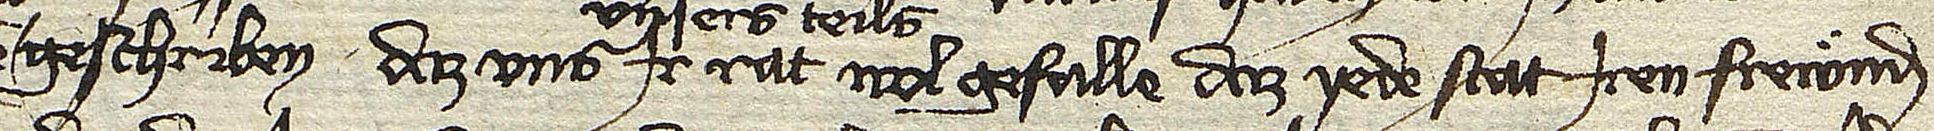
geſchriben daʒ vns Ir rat wol gefalle daʒ yede ſtat Iren frewnd*
